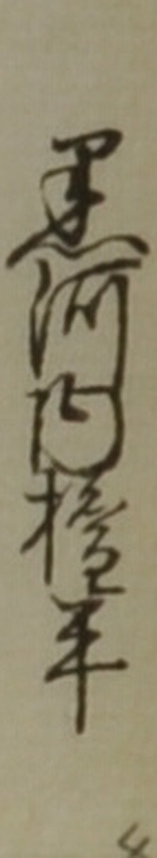黒河内権平
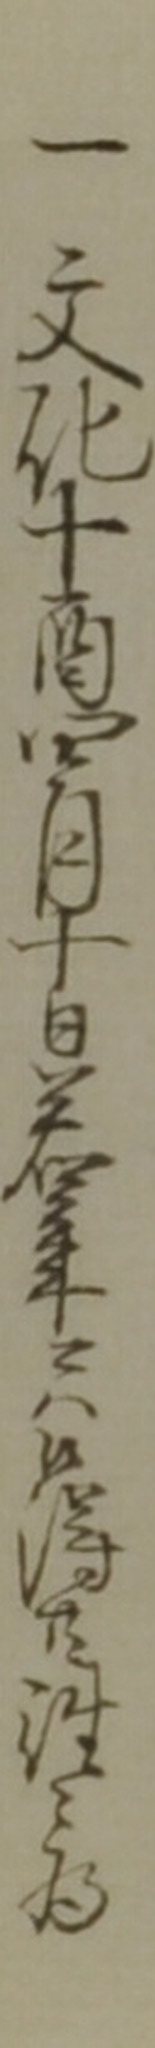一文化十酉四月十日若年候得共往々為
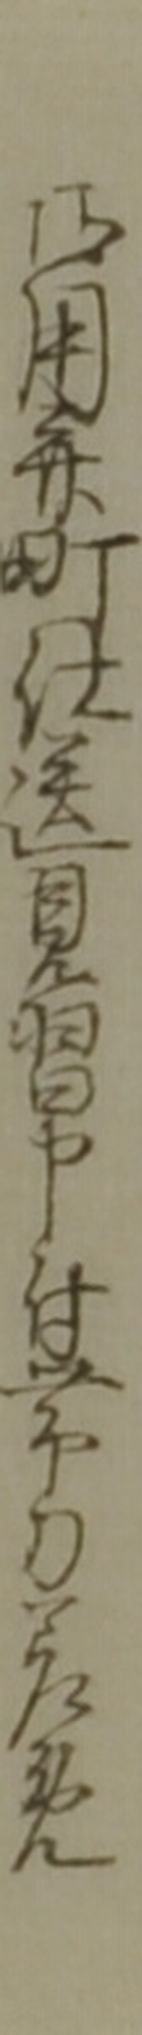御用弁町仕送見習申付帯刀差免
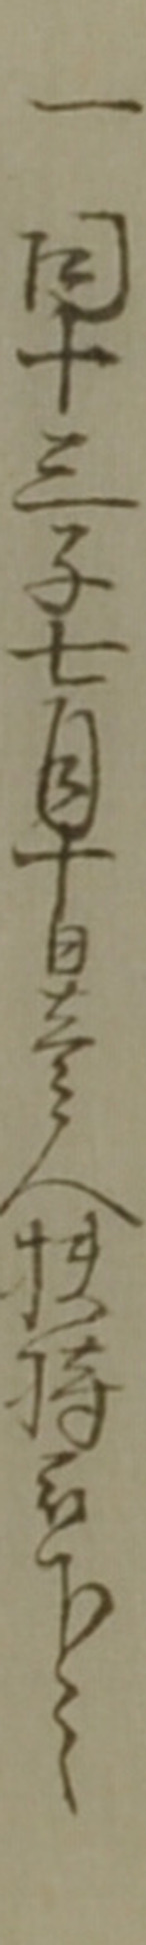一同十三子七月十日壱人扶持被下之
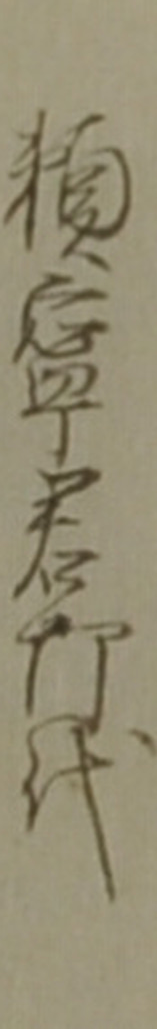頼寧君御代
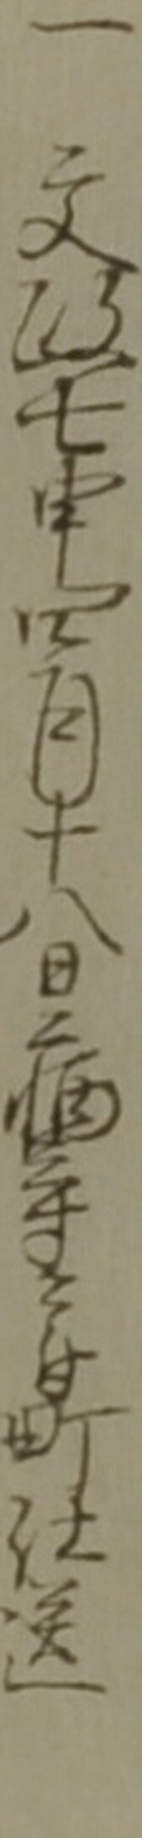一文政七申四月十八日病気ニ付町仕送
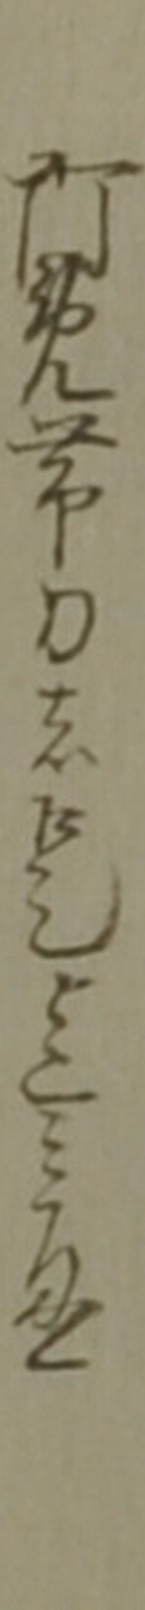御免帯刀者是迄之通
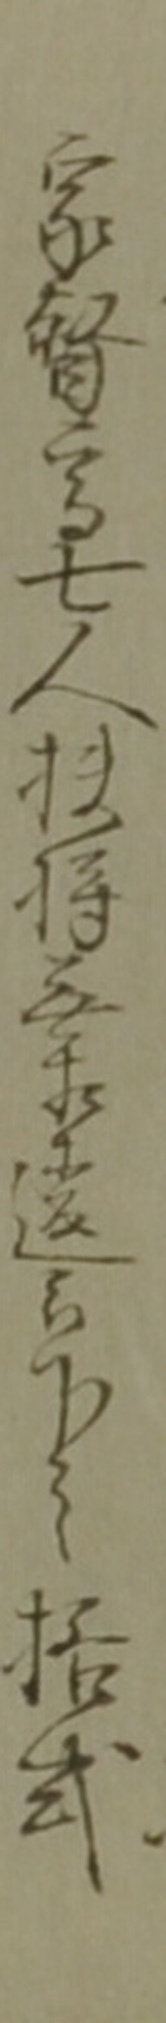家督高七人扶持無相違被下之格式
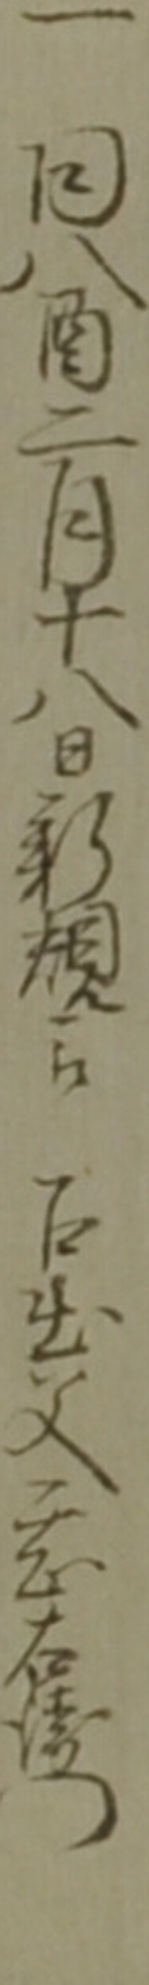一同八酉二月十八日新規被召出父甚右衛門
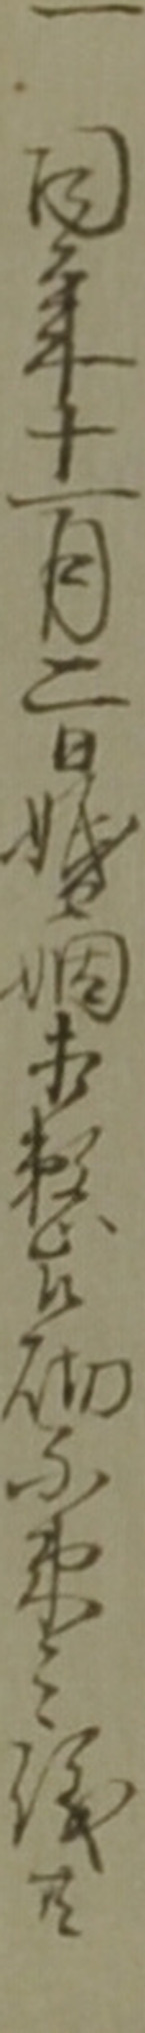一同年十一月二日婚姻相整候砌不束之儀共
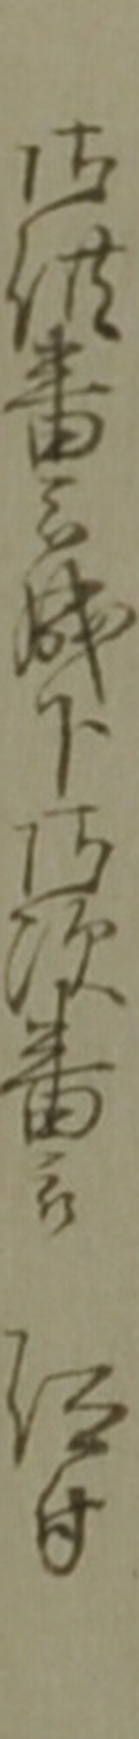御供番被成下御次番被仰付
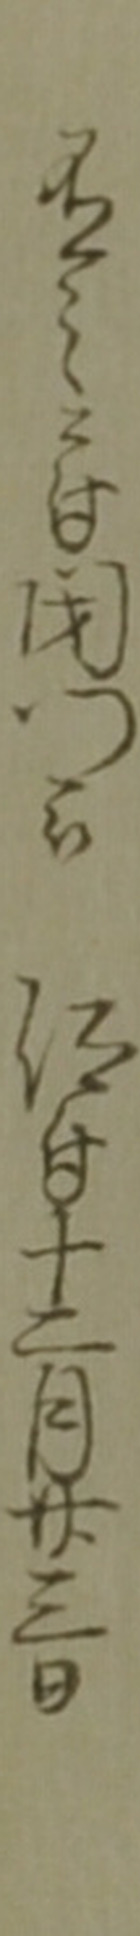有之ニ付閉門被仰付十二月廿三日
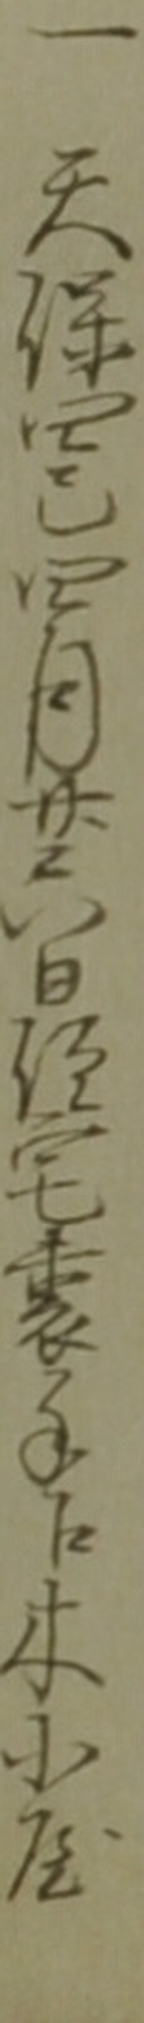一天保四巳四月廿六日住宅裏手江木小屋
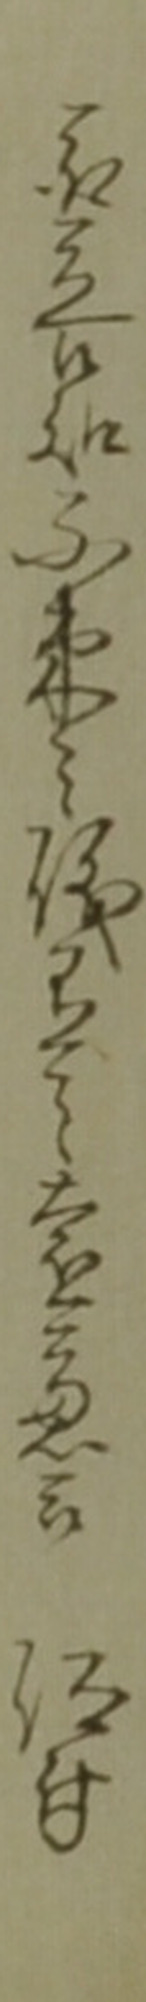取立候処不束之儀有之遠慮被仰付
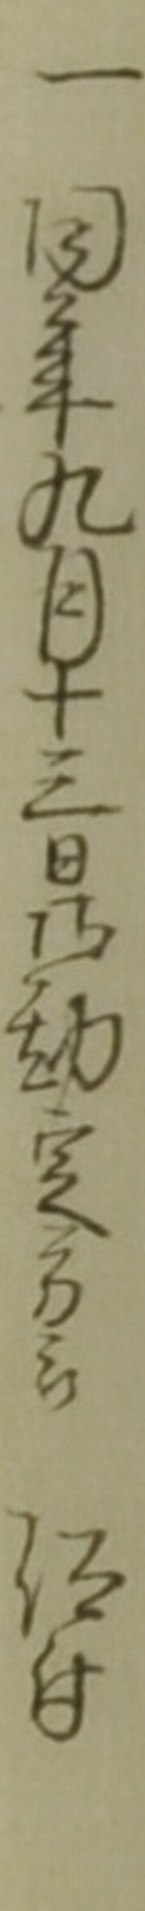一同年九月十三日御勘定方被仰付
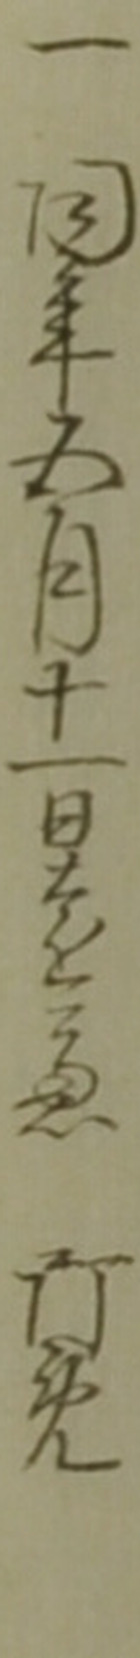一同年五月十一日遠慮御免
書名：無足廃家（壱）
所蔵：伊那市立高遠町図書館・合同会社AMANE
